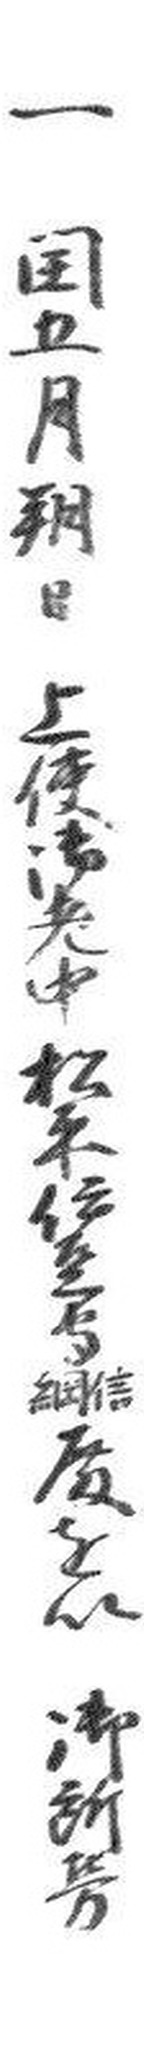一閏五月朔日上使御老中松平伊豆守信綱殿を以御所労
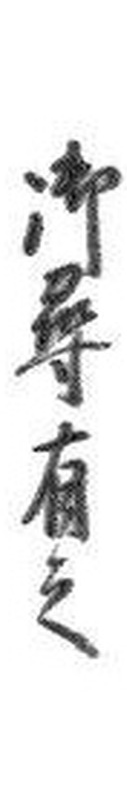御尋有之
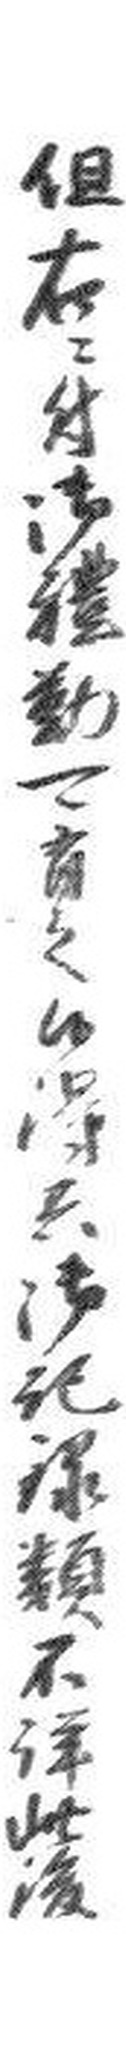但右ニ付御礼勤可有之候得共御記録類不詳此後
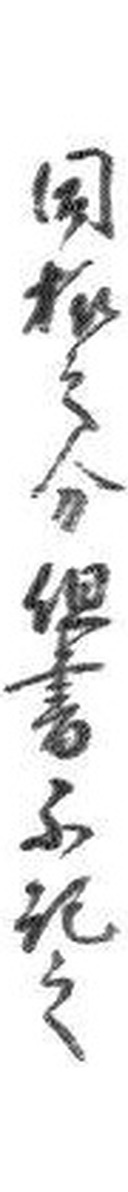同様之分但書不記之
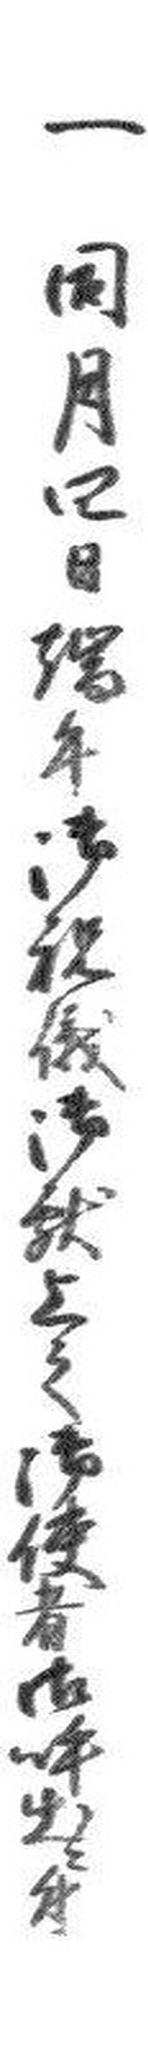一同月四日端午御祝儀御献上之御使者御呼出ニ付
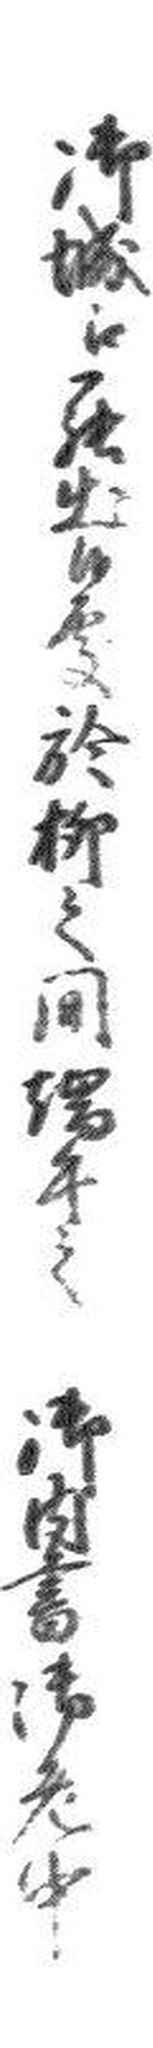御城江罷出候処於柳之間端午之御内書御老中
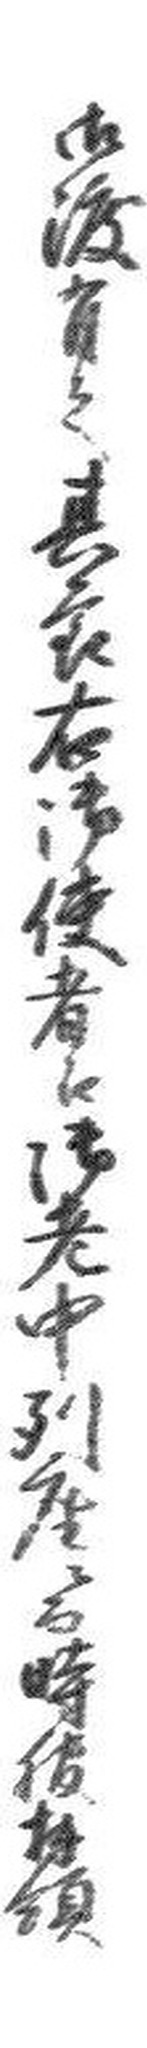御渡有之其節右御使者江御老中列座ニ而時服拝領
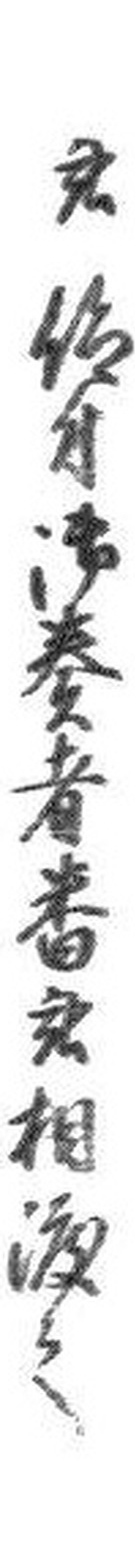被仰付御奏者番被相渡之
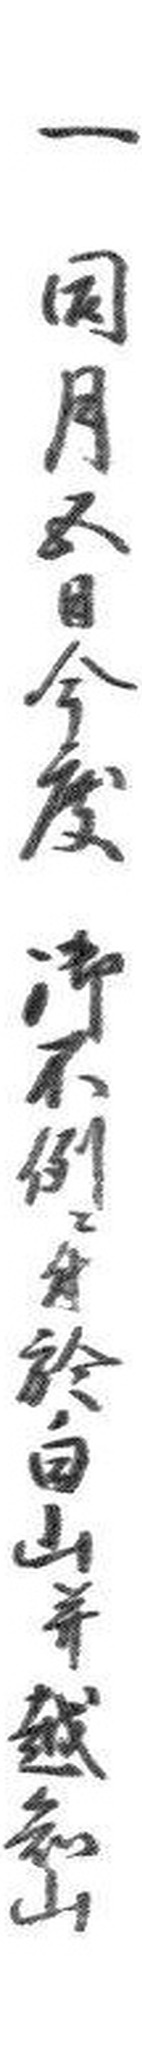一同月五日今度御不例ニ付於白山并越知山
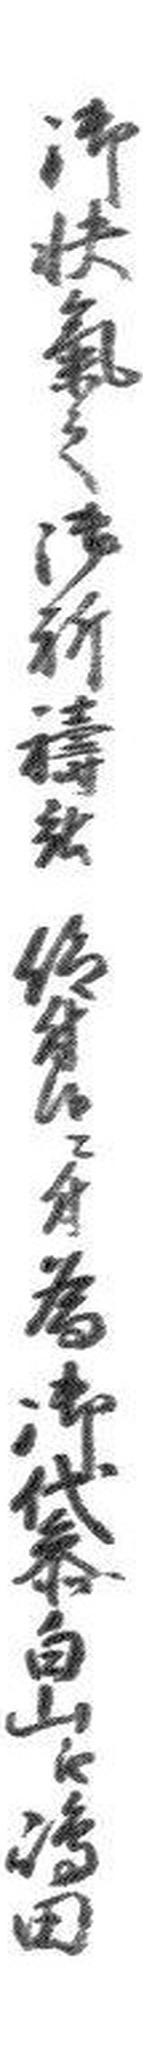御快気之御祈祷被仰付候ニ付為御代参白山江嶋田
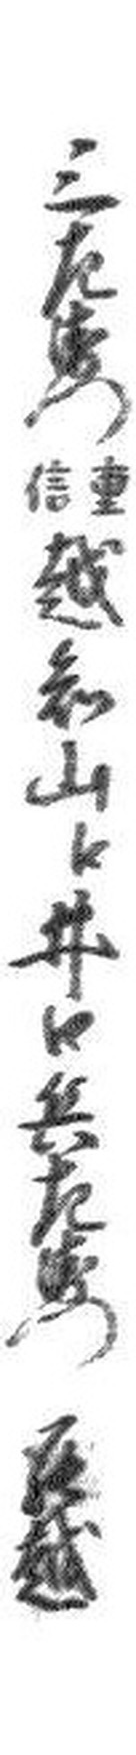三左衛門重信越知山江井口兵左衛門罷越

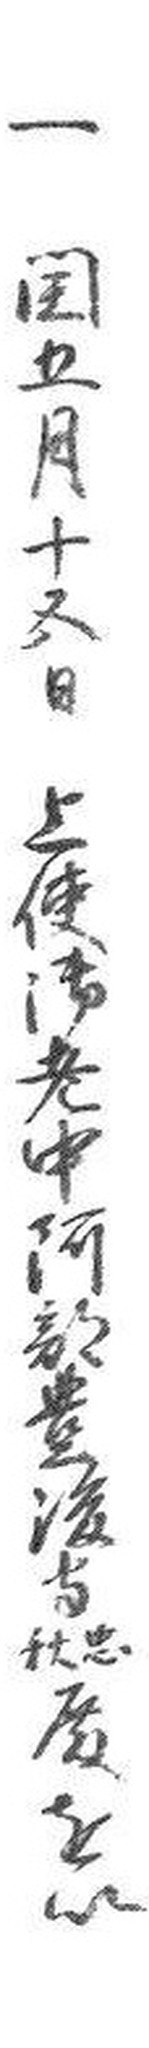一閏五月十五日上使御老中阿部豊後守忠秋殿を以
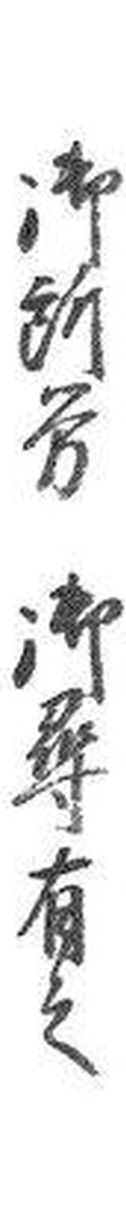御所労御尋有之
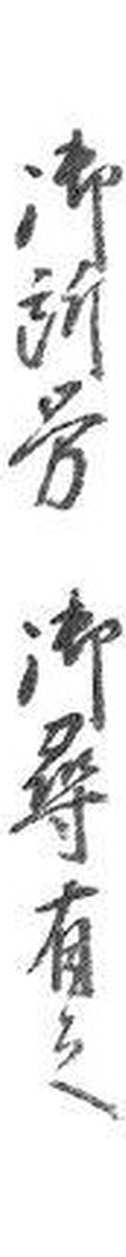御所労御尋有之
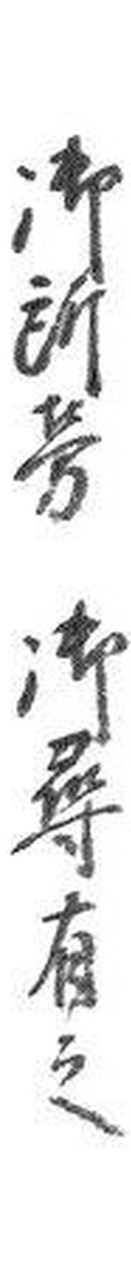御所労御尋有之
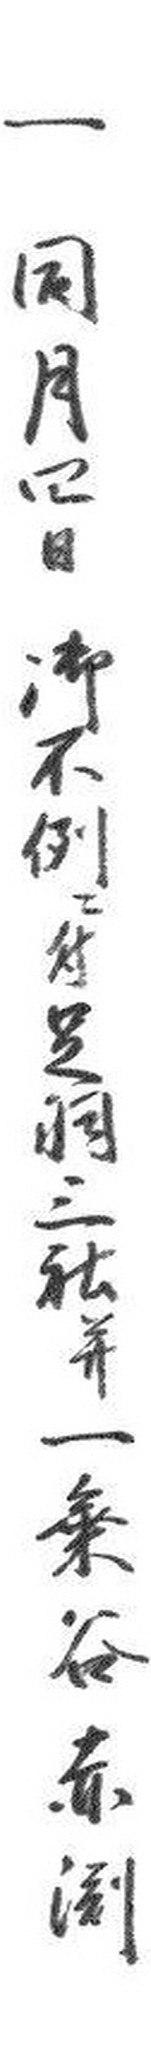一同月四日御不例ニ付足羽三社并一乗谷赤渕
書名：家譜 四 忠昌公 従寛永七年到正保四年
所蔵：福井県文書館 Fukui Prefectural Archives
